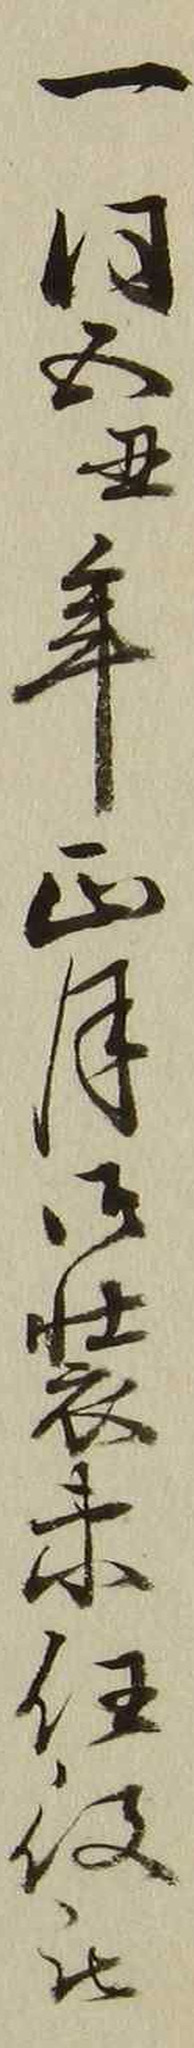一同五丑年正月御装束任役被
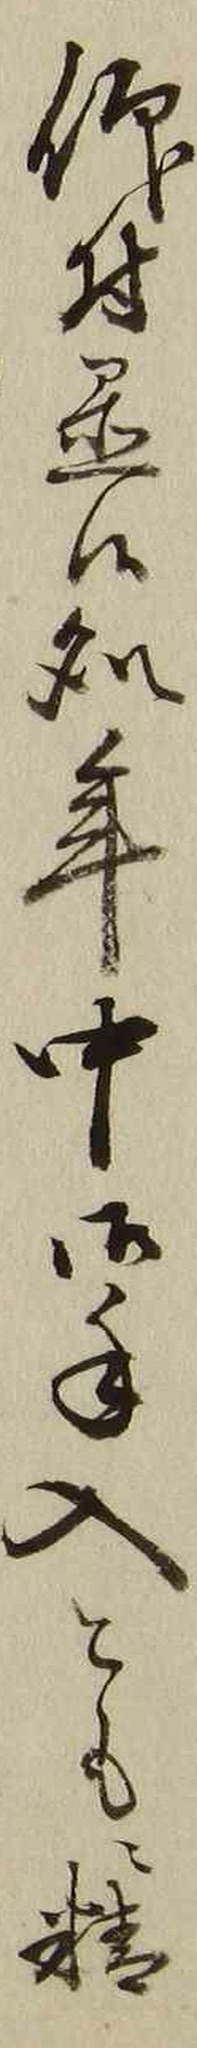仰付置候処年中御手入ともニ精
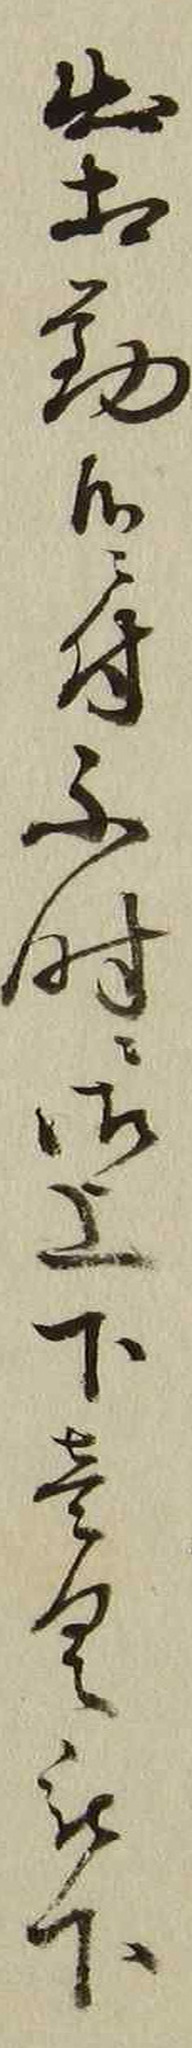出相勤候ニ付不時ニ御上下壱具被下
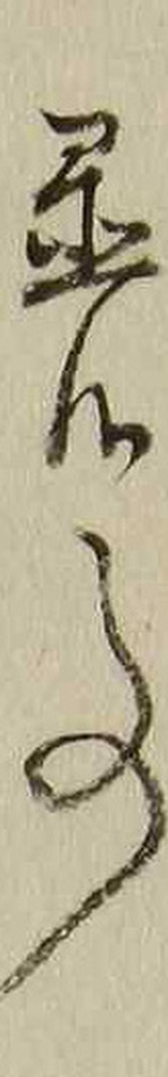置候事
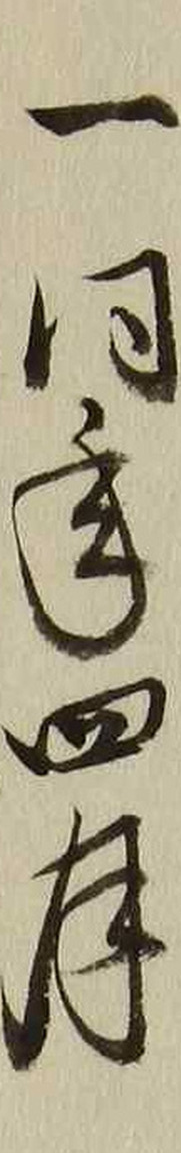一同年四月
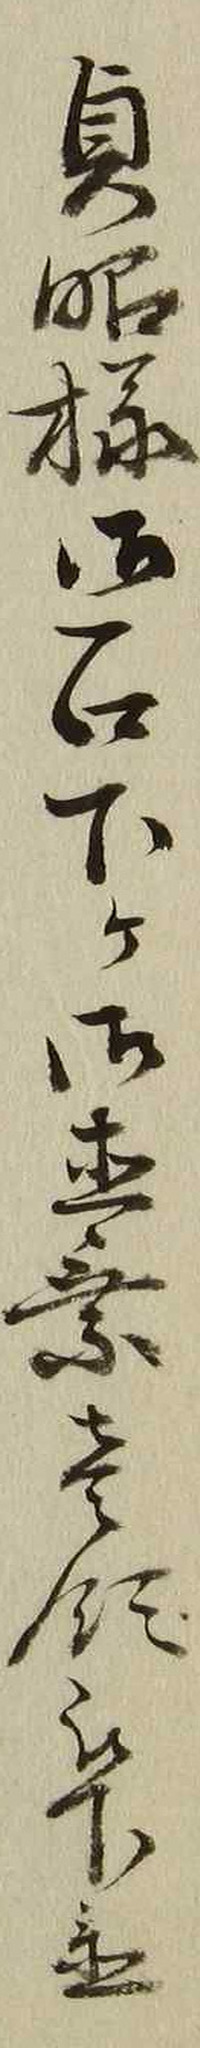貞昭様御召下ケ御直乗壱領被下置
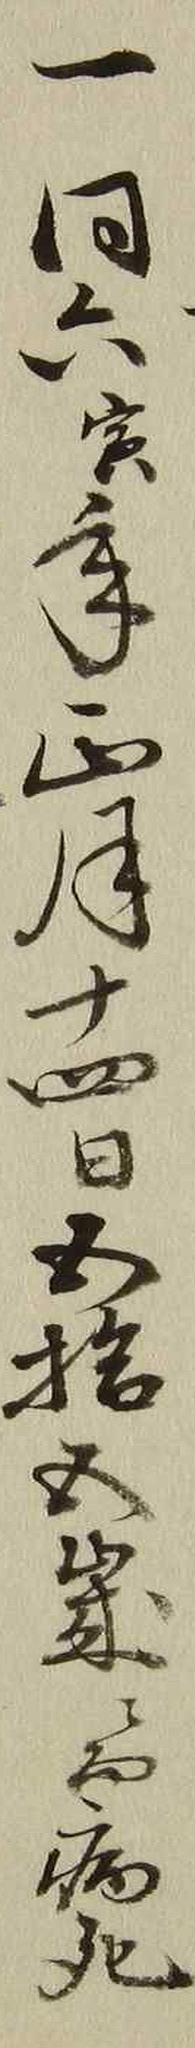一同六寅年正月十四日五拾五歳ニ而病死
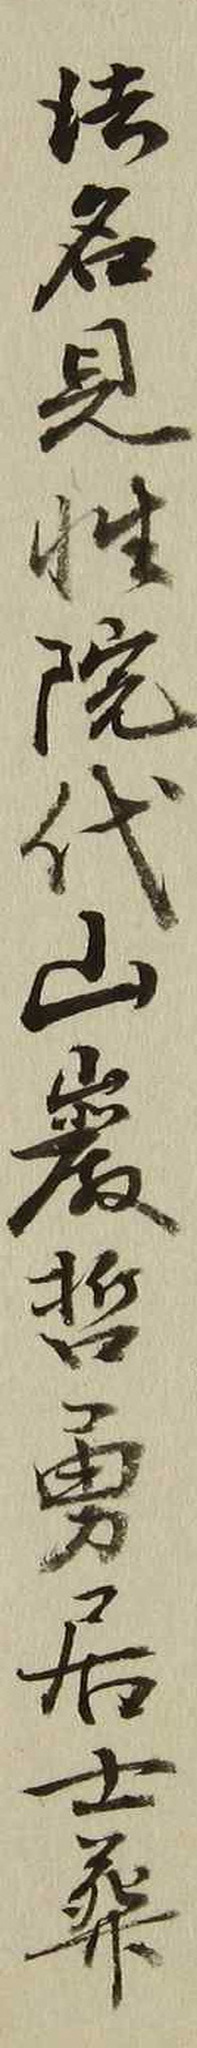法名見性院代山巌哲勇居士葬
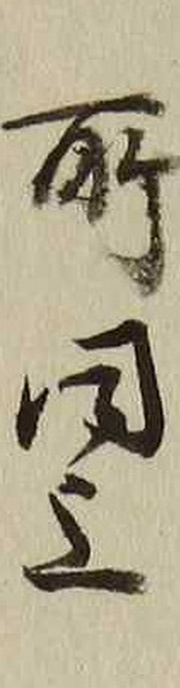所同上
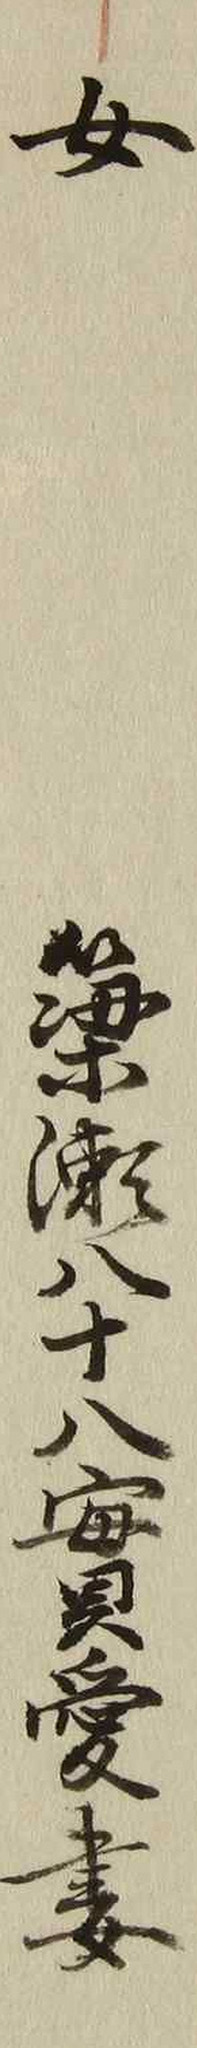女簗瀬八十八実愛妻
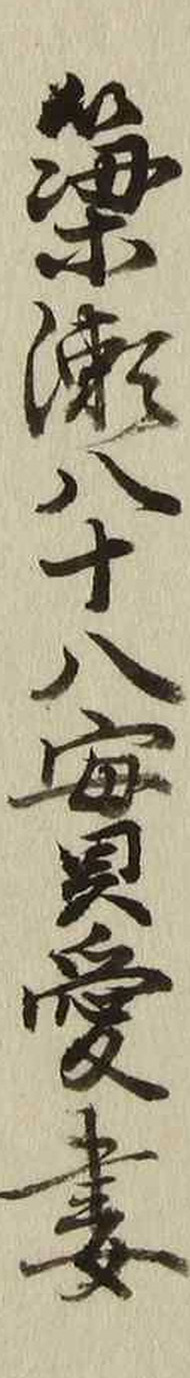女簗瀬八十八実愛妻
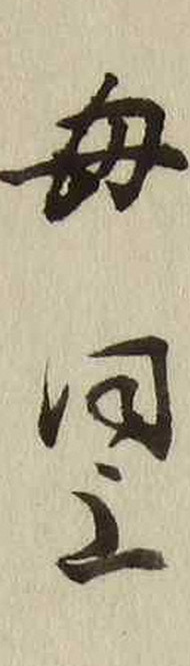母同上
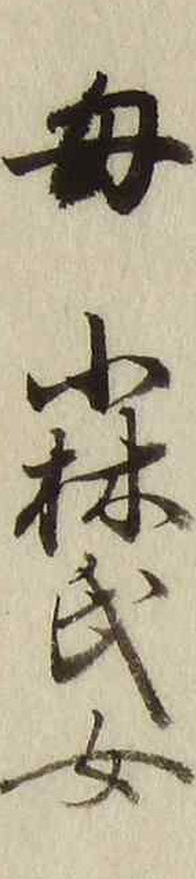母小林氏女

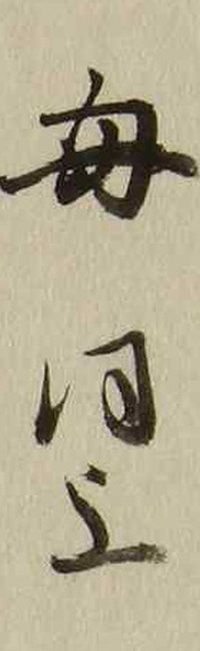母同上
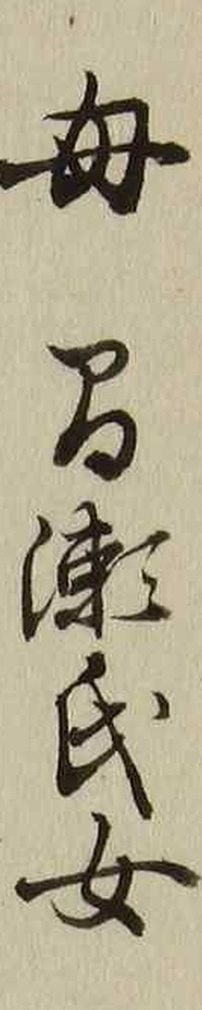母間瀬氏女
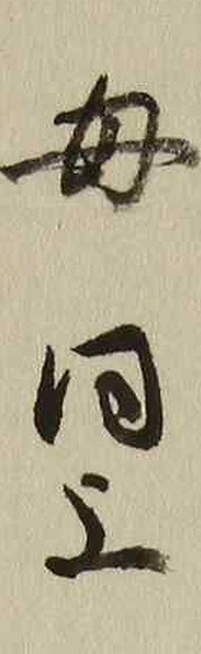母同上
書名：諸士系譜　巻之35　は之部3
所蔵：会津若松市立会津図書館
